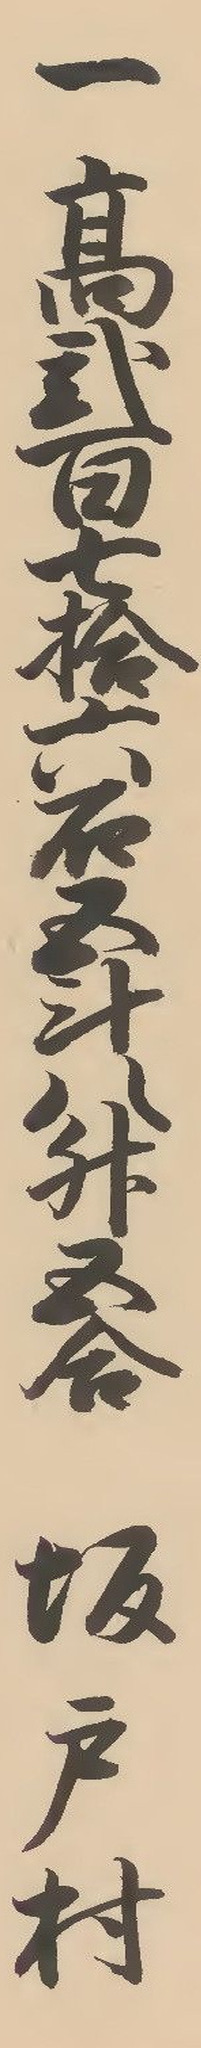一髙弐百七拾六石五斗八升五合坂戸村

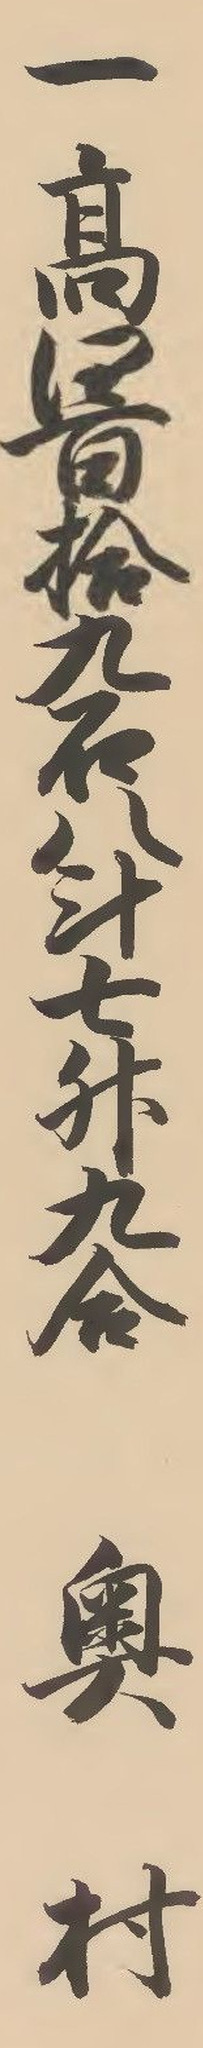一髙四百拾九石八斗七升九合奥村
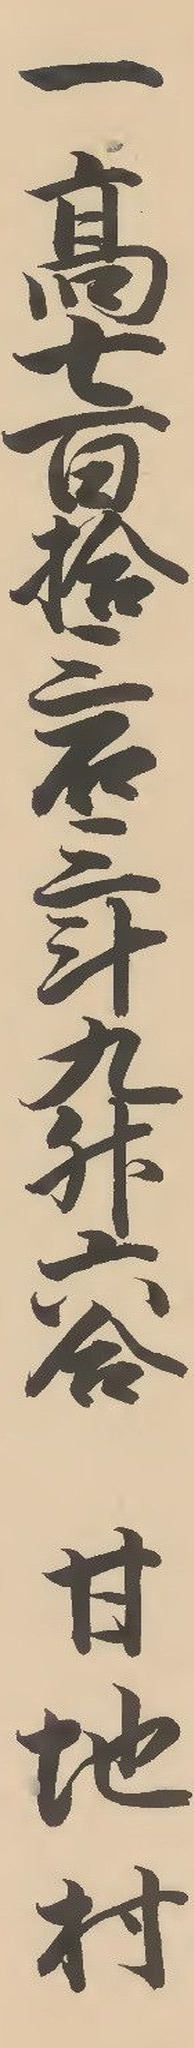一髙七百拾三石三斗九升六合甘地村
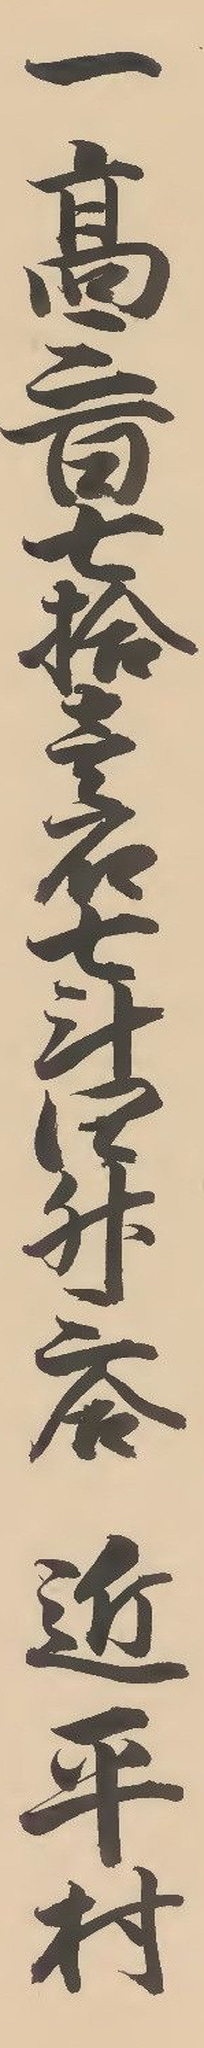一髙三百七拾壱石七斗四升三合近平村
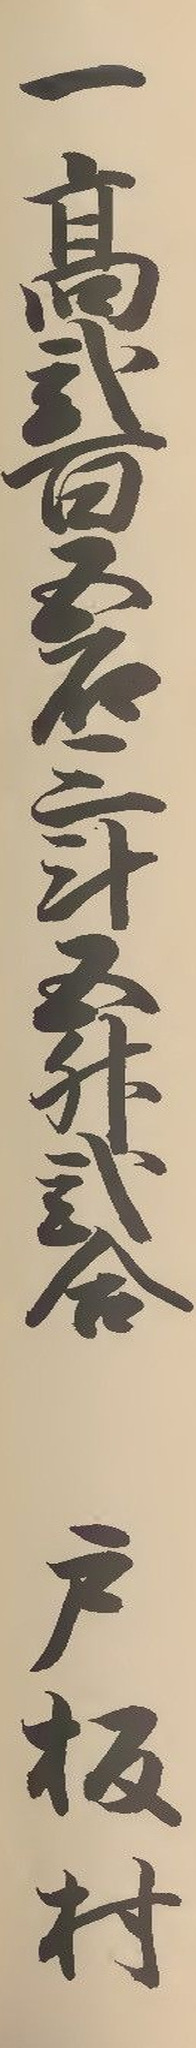一髙弐百五石三斗五升弐合戸板村
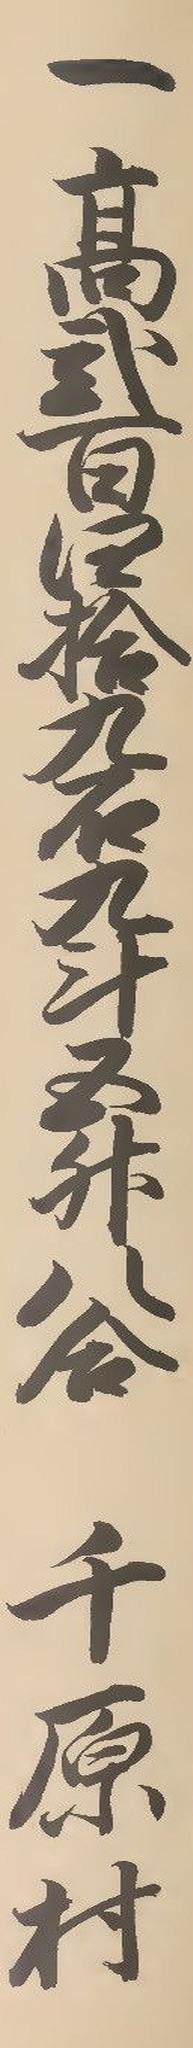一髙弐百四拾九石九斗五升八合千原村
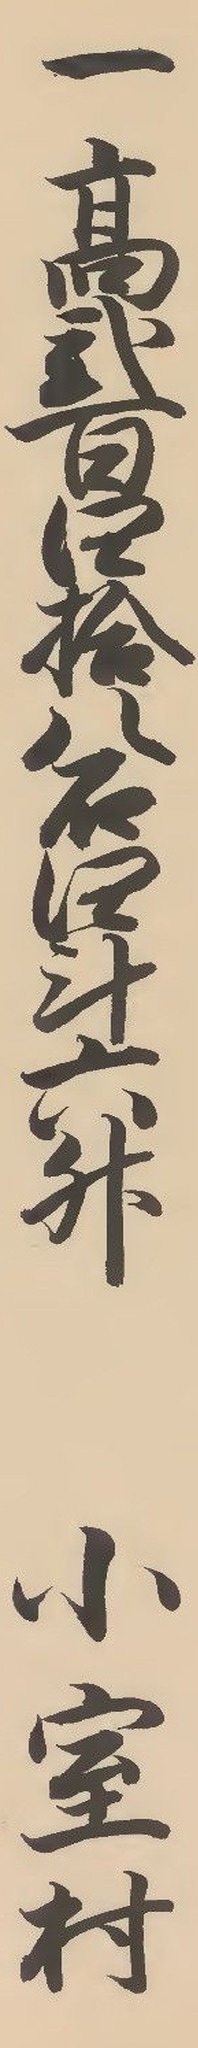一髙弐百四拾八石四斗六升小室村
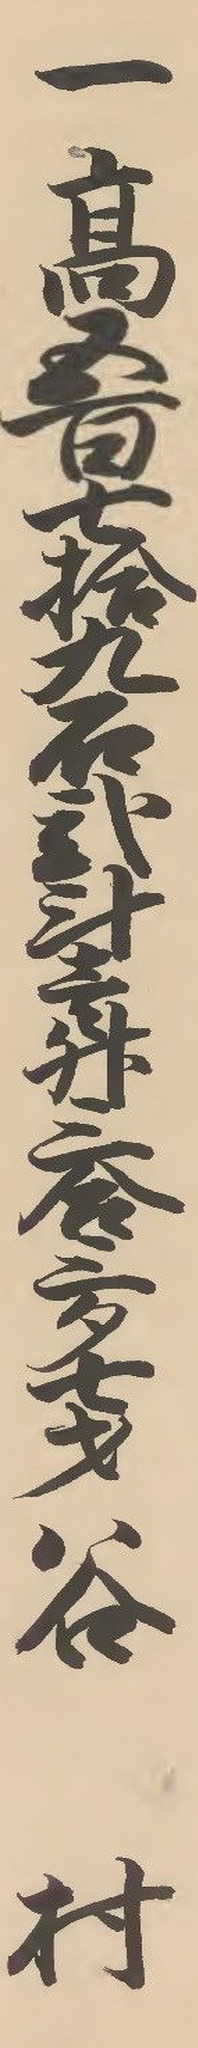一髙五百七拾九石弐斗壱升三合三夕七才
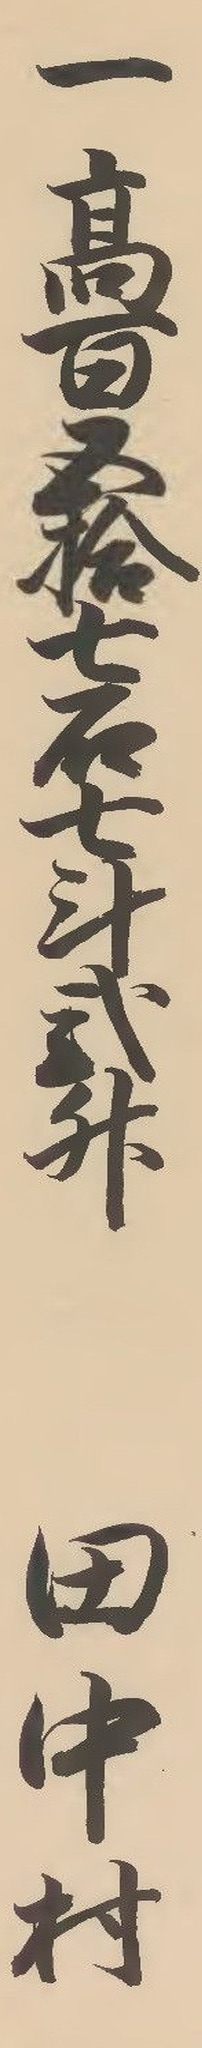一髙百五拾七石七斗壱升田中村

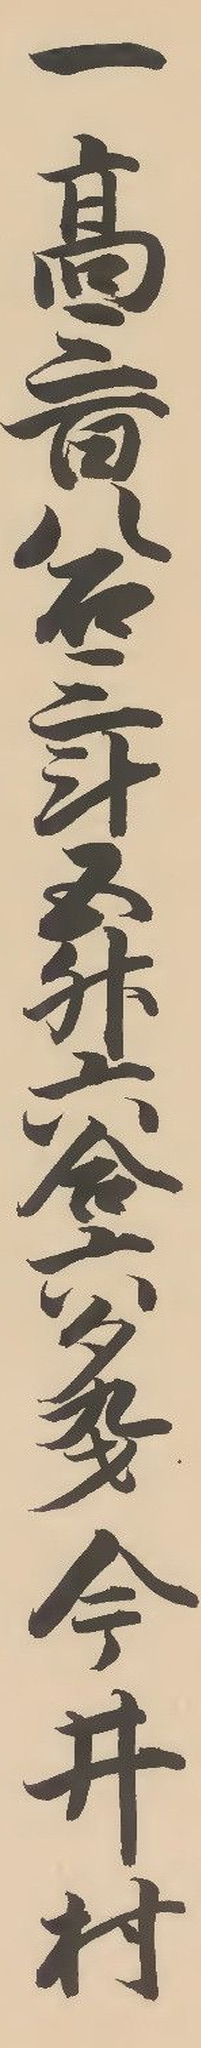一髙三百八石三斗五升六合六夕九才今井村
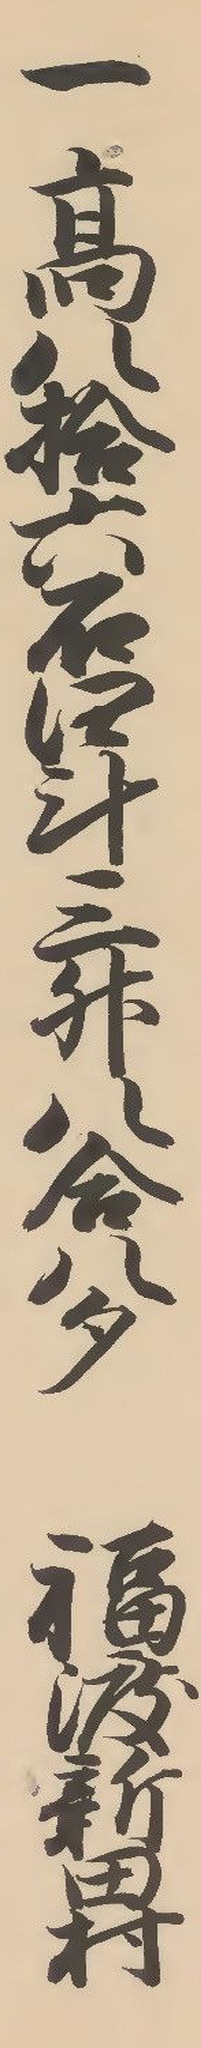一髙八拾六石四斗三升八合八夕福渡新田村
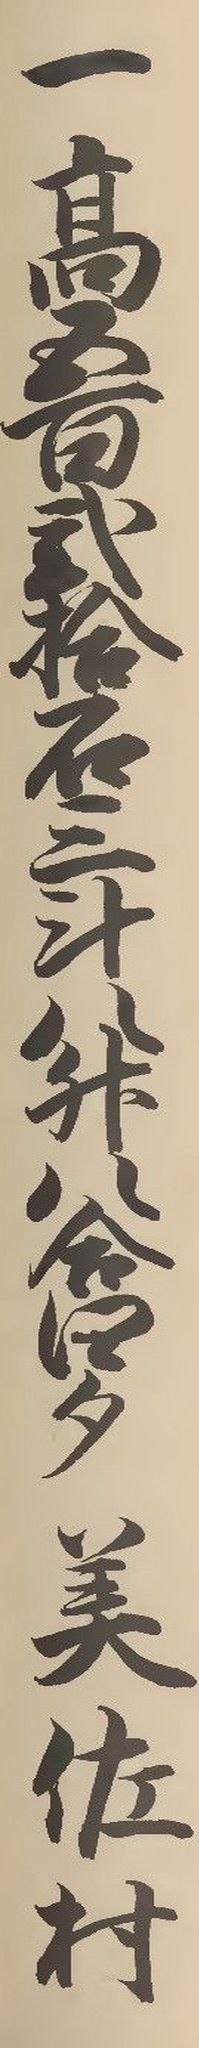一髙五百弐拾石三斗八升八合四夕美佐村
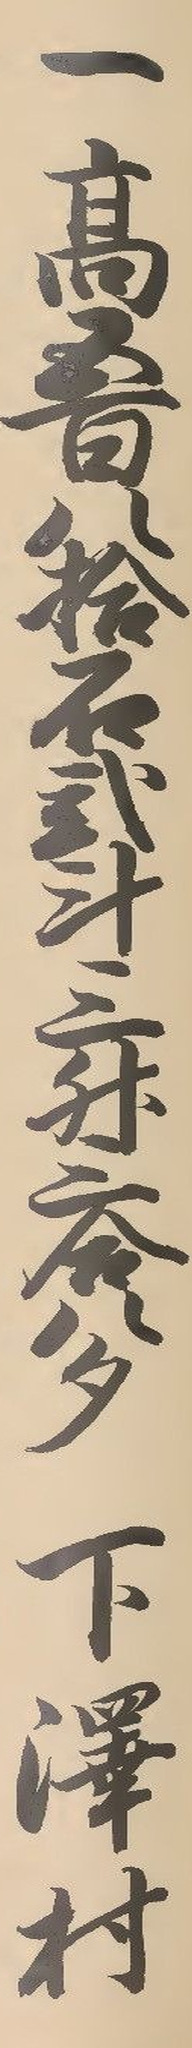一髙五百八拾石弐斗三升三合八夕下澤村
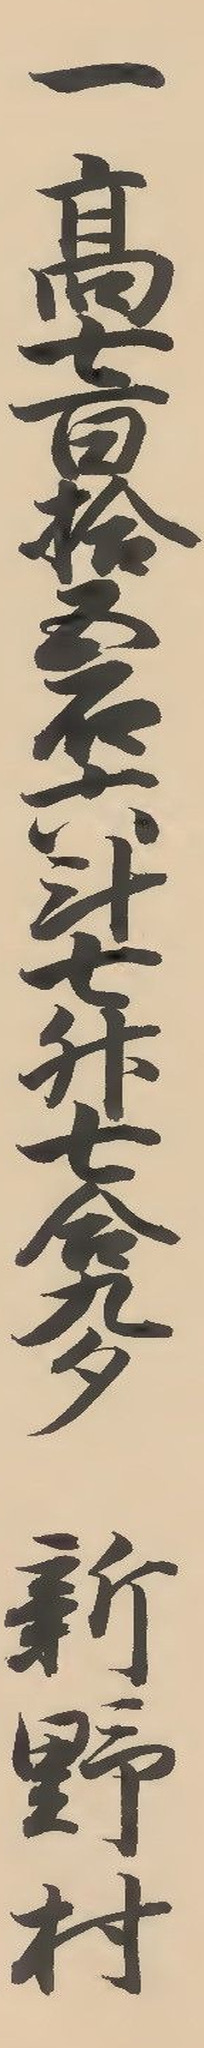一髙七百拾五石六斗七升七合九夕新野村
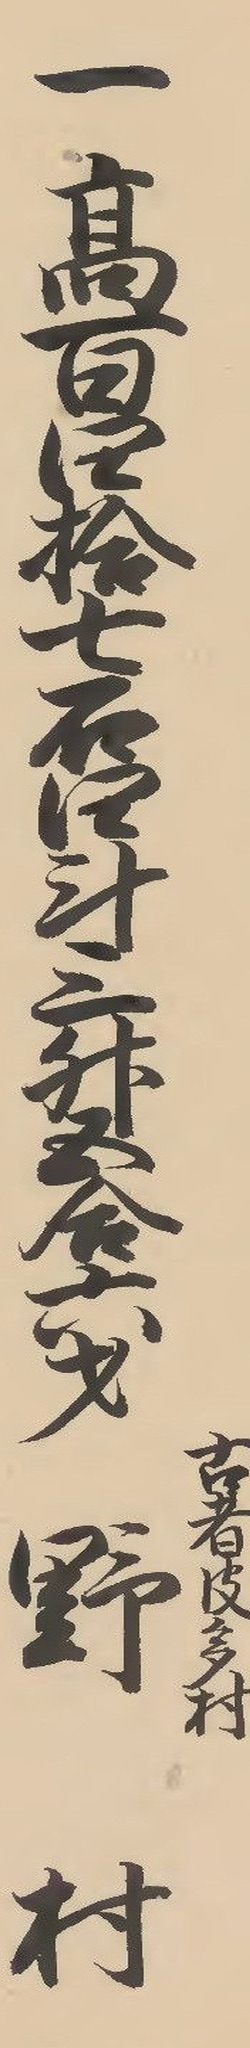一髙百四拾七石四斗弐升五合六才野村
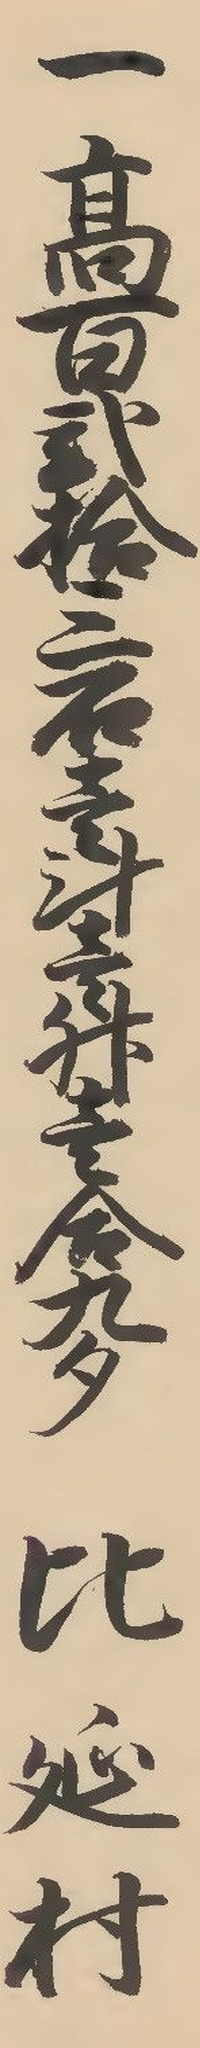一髙百弐拾三石壱斗壱升壱合九夕比延村
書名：播磨国郷帳
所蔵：国立公文書館 National Archives of Japan
